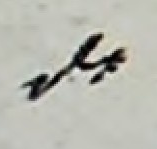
do
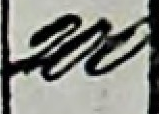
200
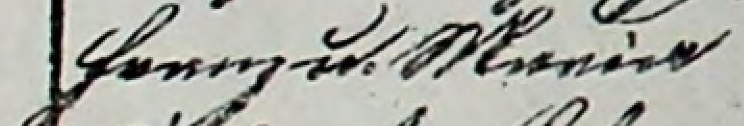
Franz u. Maria
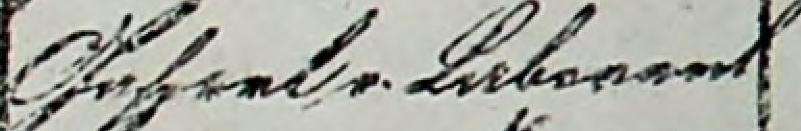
Ga???rl v. Lab???
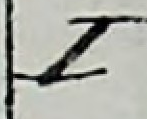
I
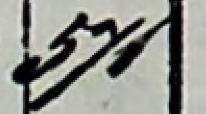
571
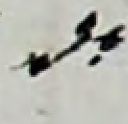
do
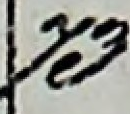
73
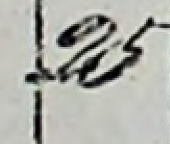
25
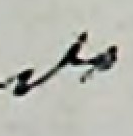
do
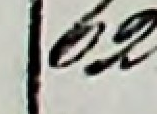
62
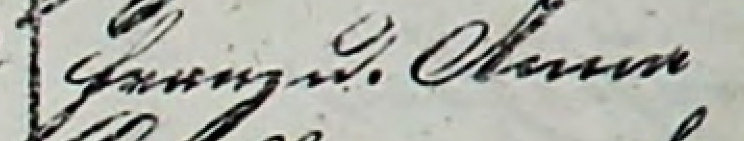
Franz u. Anna
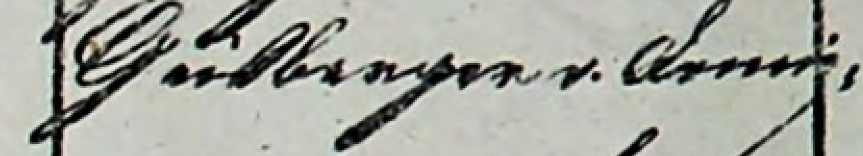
G???berger v. A???„
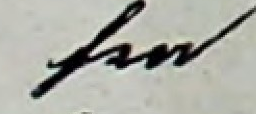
sen
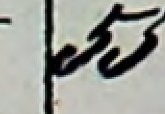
55
